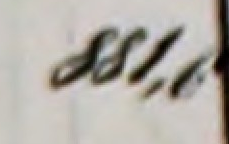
881,6
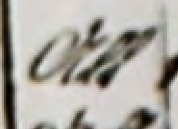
Alt
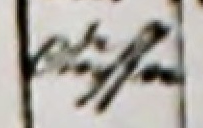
Ausee
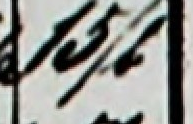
15/b
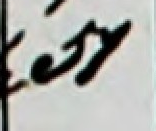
51
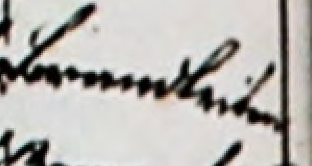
Brandleiten
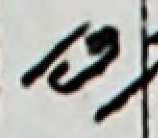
13
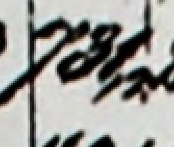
731,2
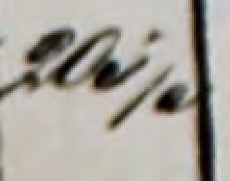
20?/a
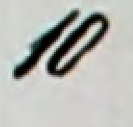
10
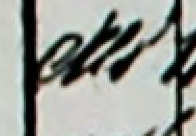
Alt
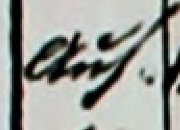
Aus„
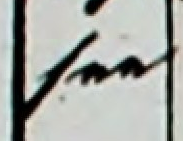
see
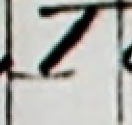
I
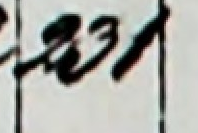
231
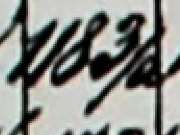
1183/a
